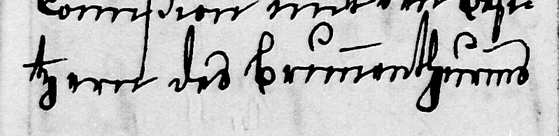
tzern des Brunnenthurms
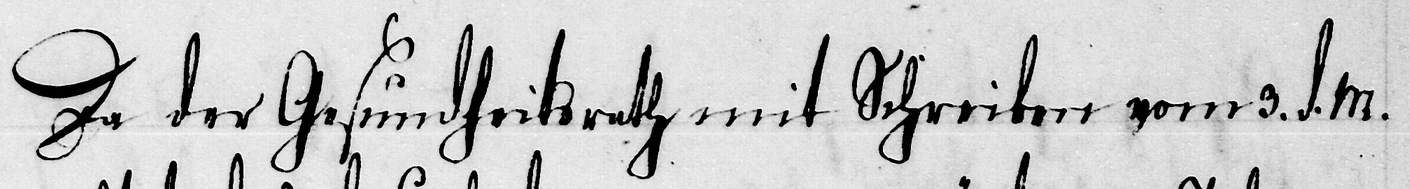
Da der Gesundheitsrath mit Schreiben vom 3. d. M.
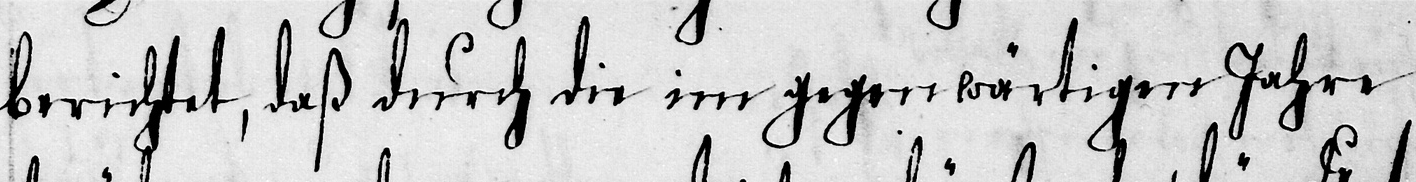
berichtet, daß durch die im gegenwärtigen Jahre
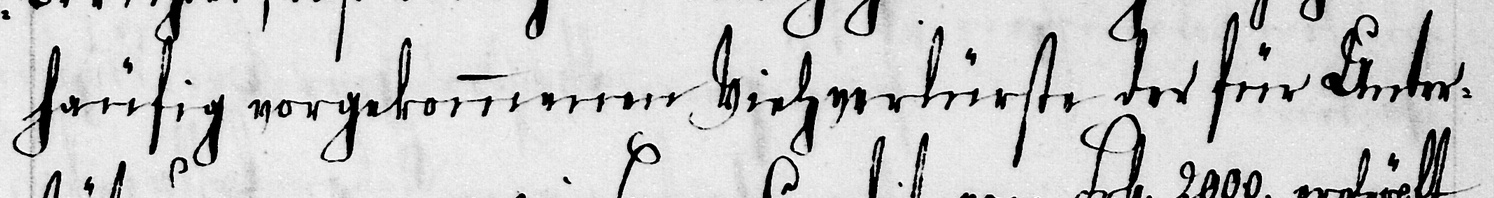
häufig vorgekommenen Viehverlürste der für Unter¬
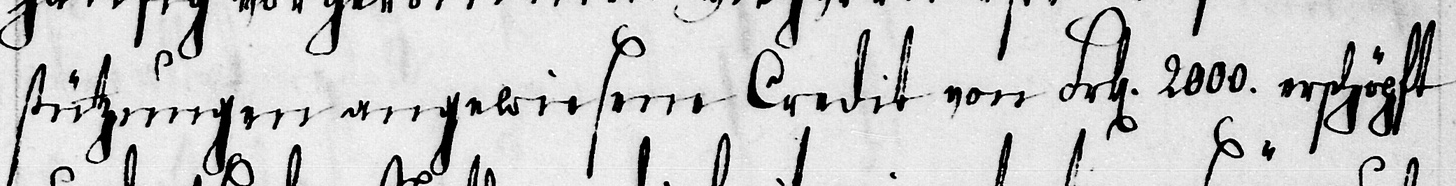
stützungen angewiesene Credit von Frk[en]. 2000. erschöpft
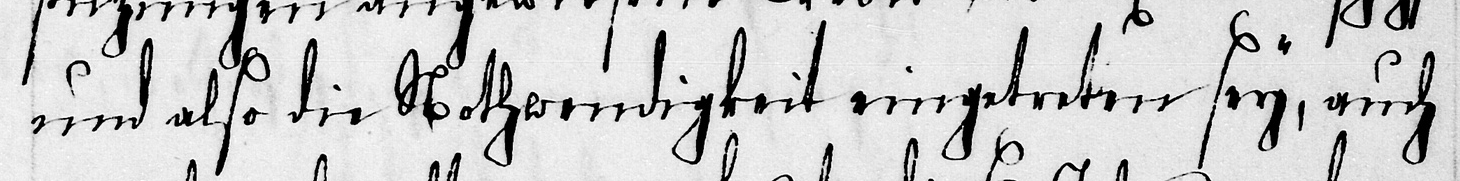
und also die Nothwendigkeit eingetreten sey, auch
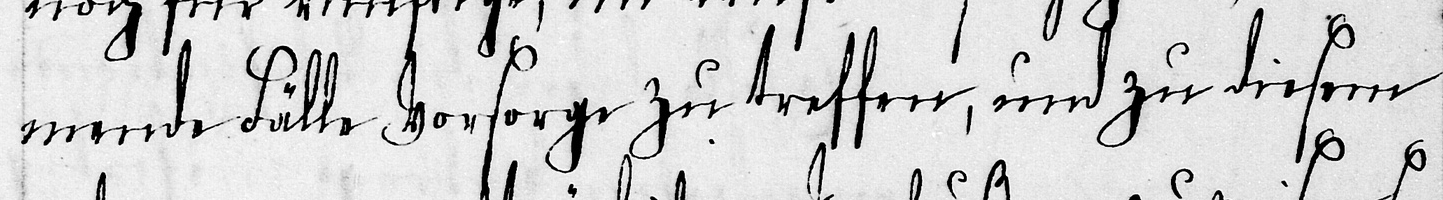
mende Fälle Vorsorge zu treffen, und zu diesem
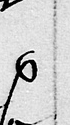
3.
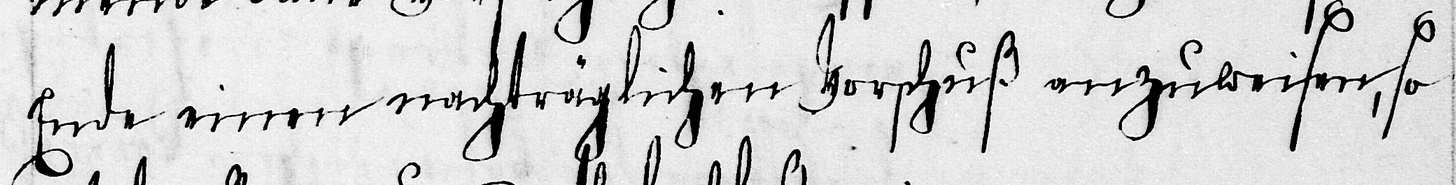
Ende einen nachträglichen Vorschuß anzuweisen, so
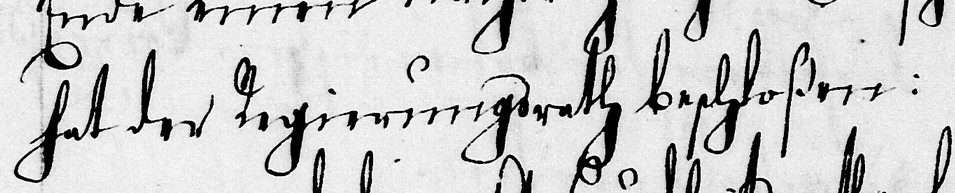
hat der Regierungsrath beschloßen:
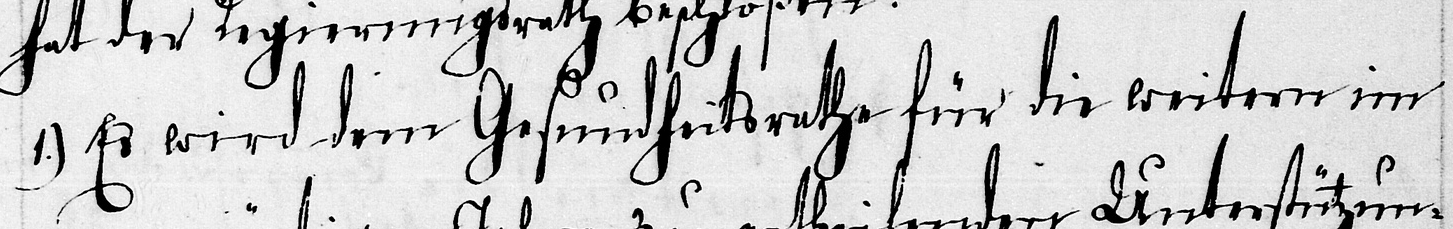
1.) Es wird dem Gesundheitsrathe für die weitern im
